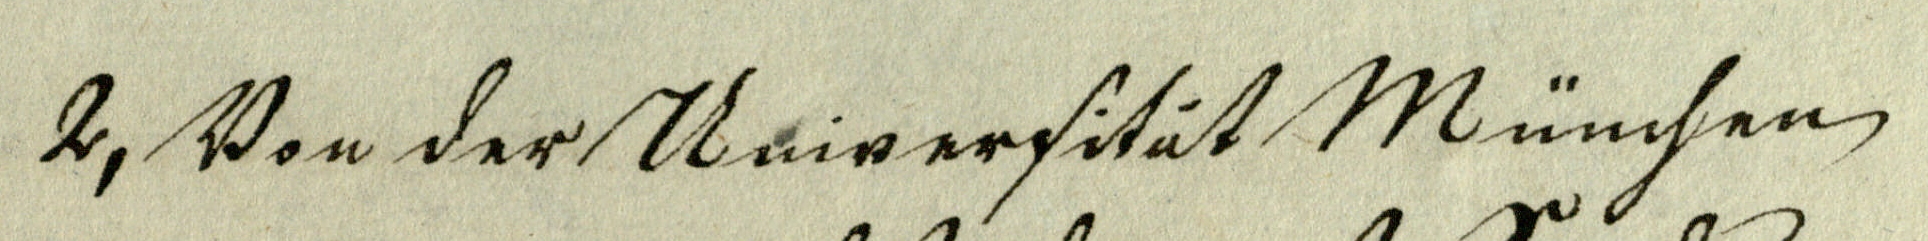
2. Von der Universität München
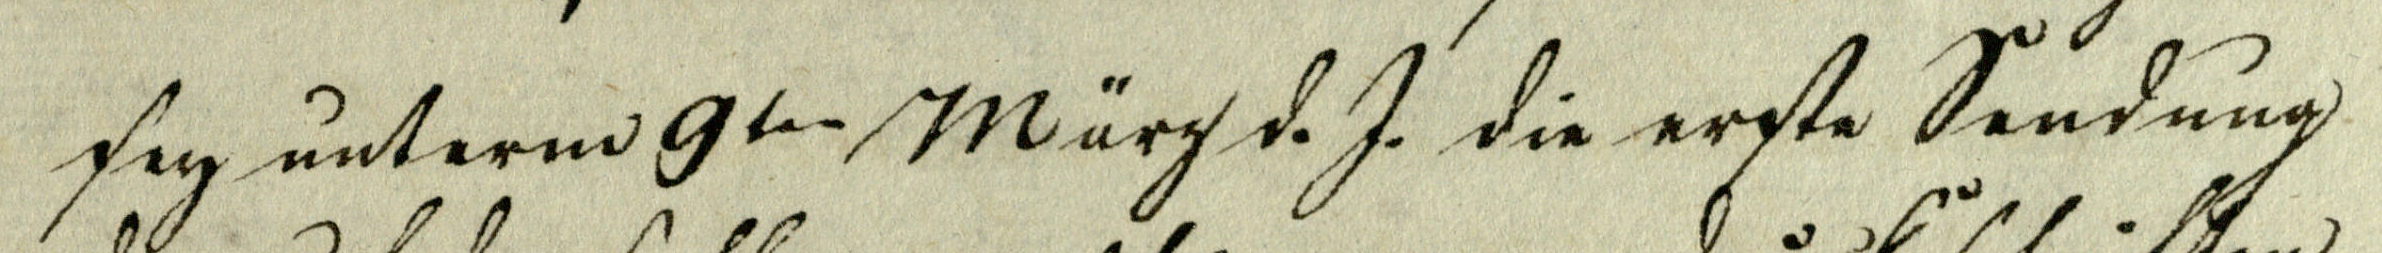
sey unterm 9 ten März d. J. die erste Sendung
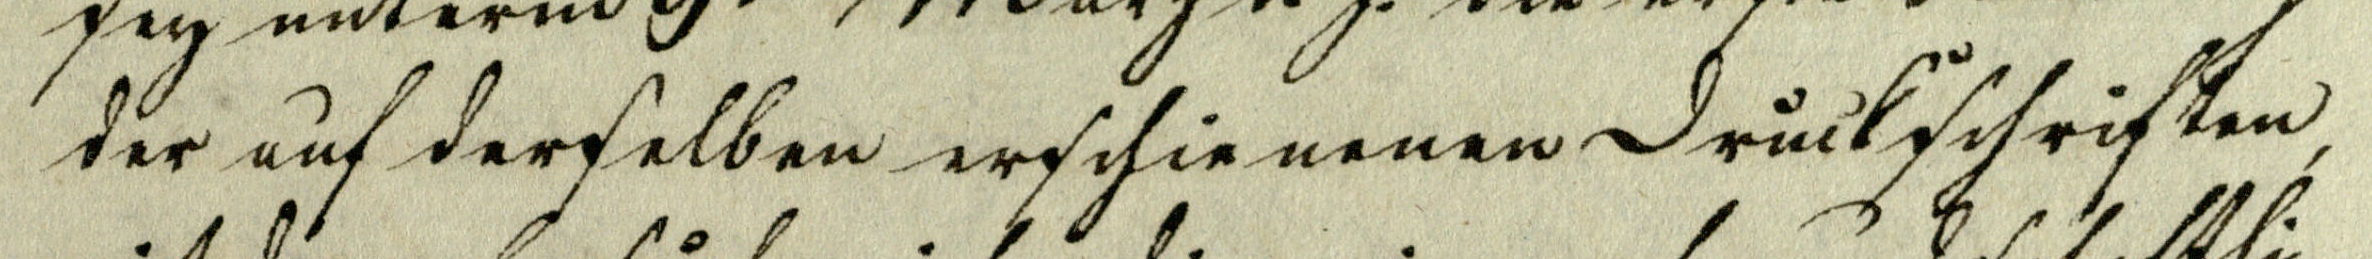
der auf derselben erschienenen Druckschriften
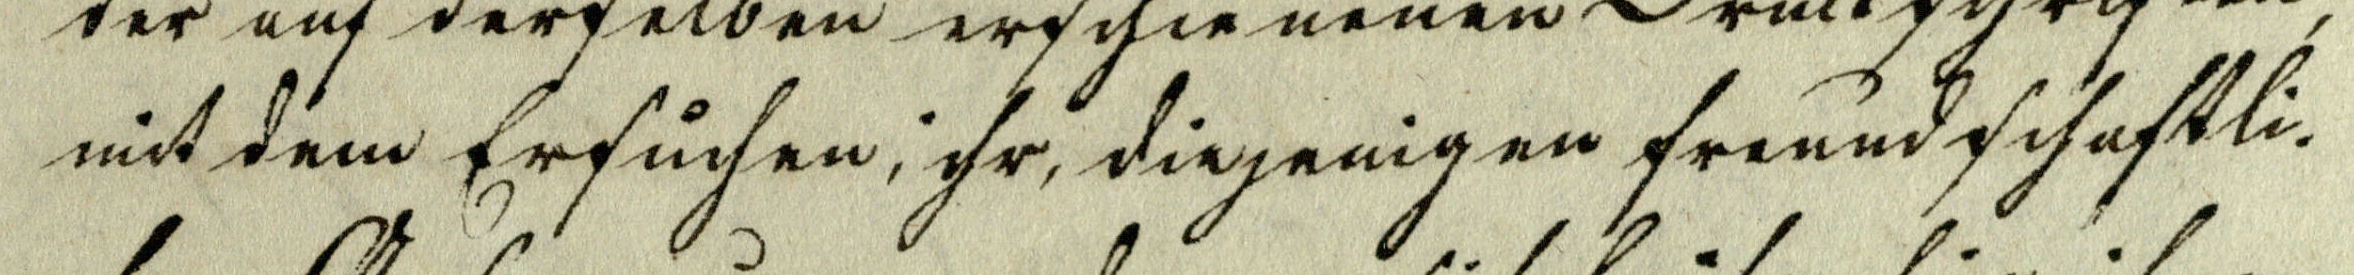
mit dem Ersuchen, ihr, diejenigen freundschaftli¬
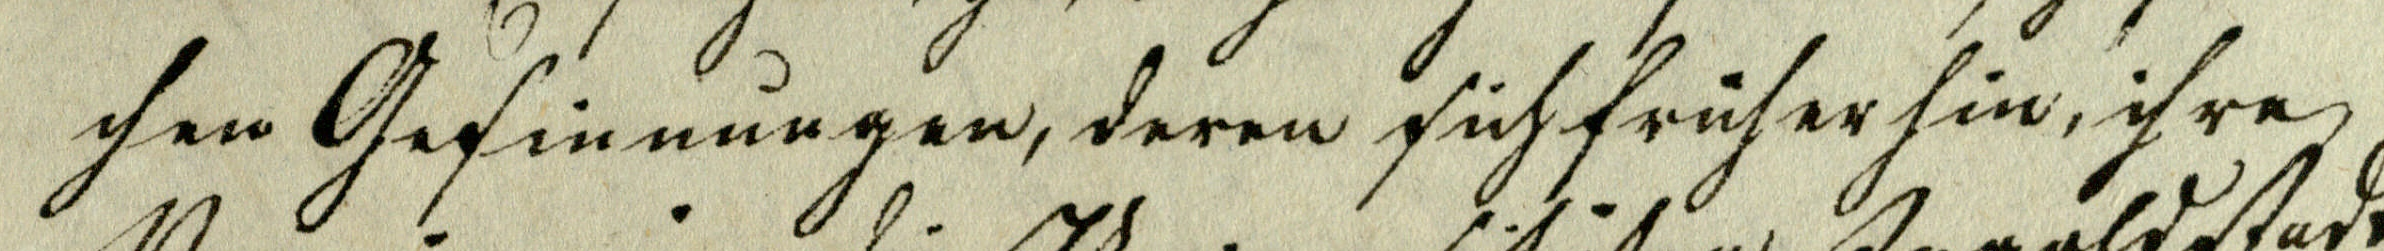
chen Gesinnungen, deren sich früher hin, ihre,
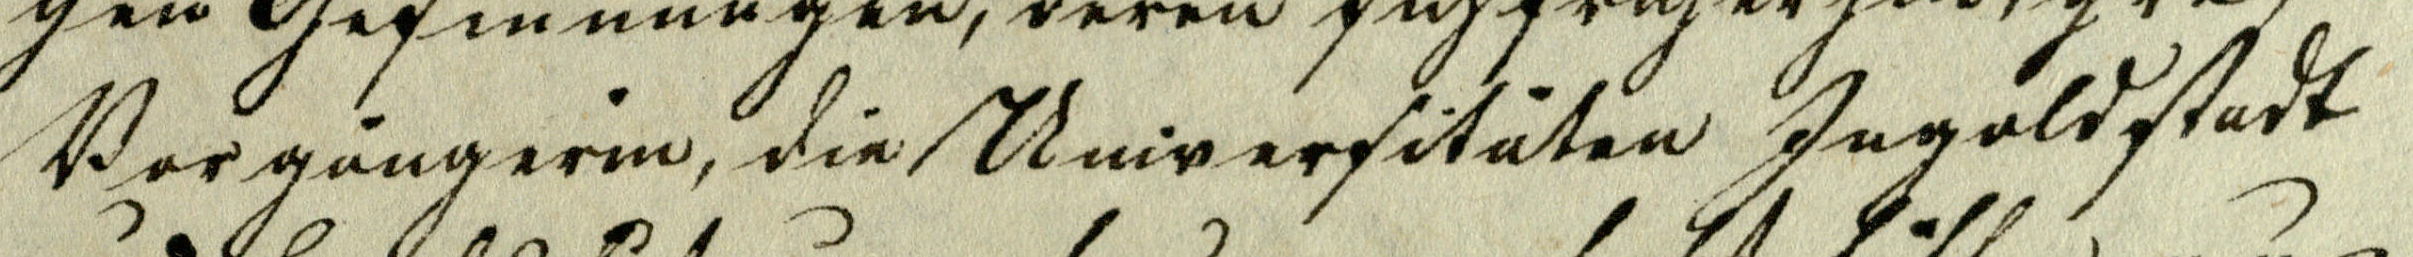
Vorgängerin, die Universitäten Ingoldstadt
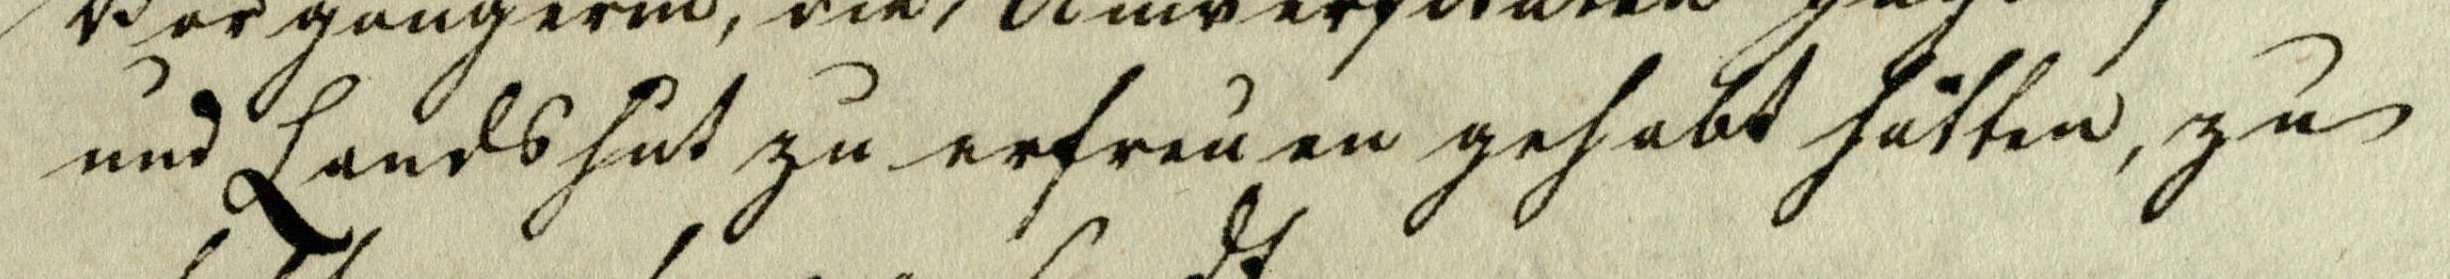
und Landshut zu erfreuen gehabt hätten, zu
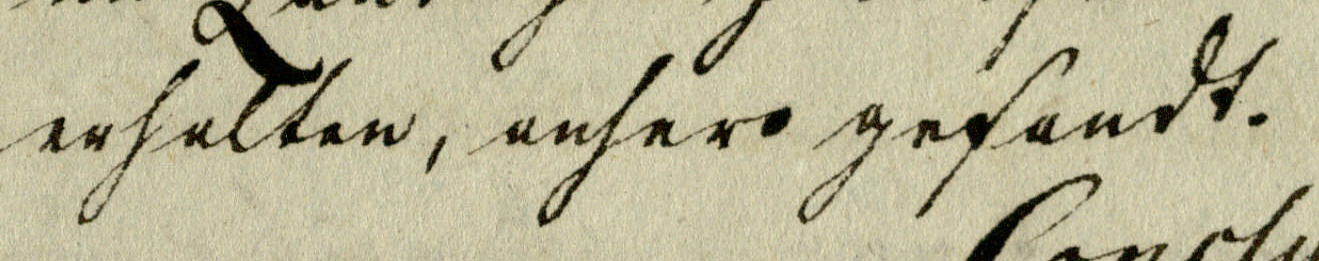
erhalten, anhero gesandt.
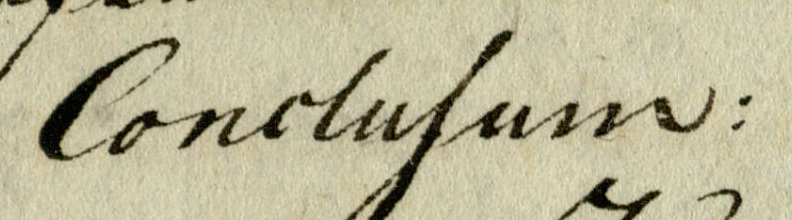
Conclusum:
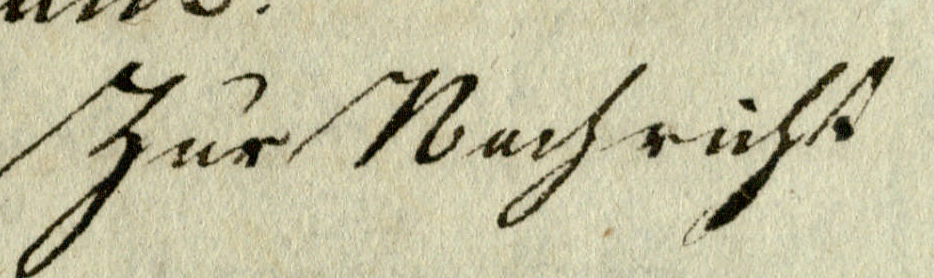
zur Nachricht
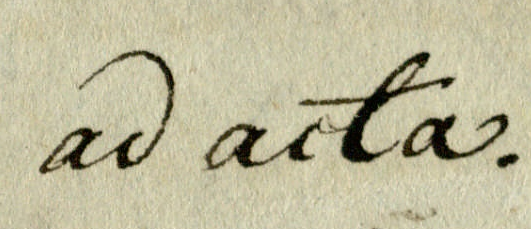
ad acta.
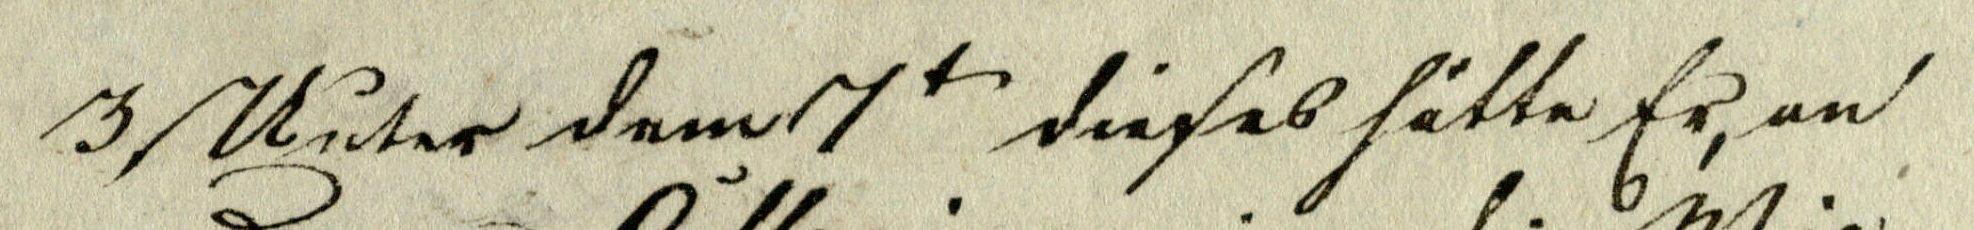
3. Unter dem 7 ten dieses hätte Er, an
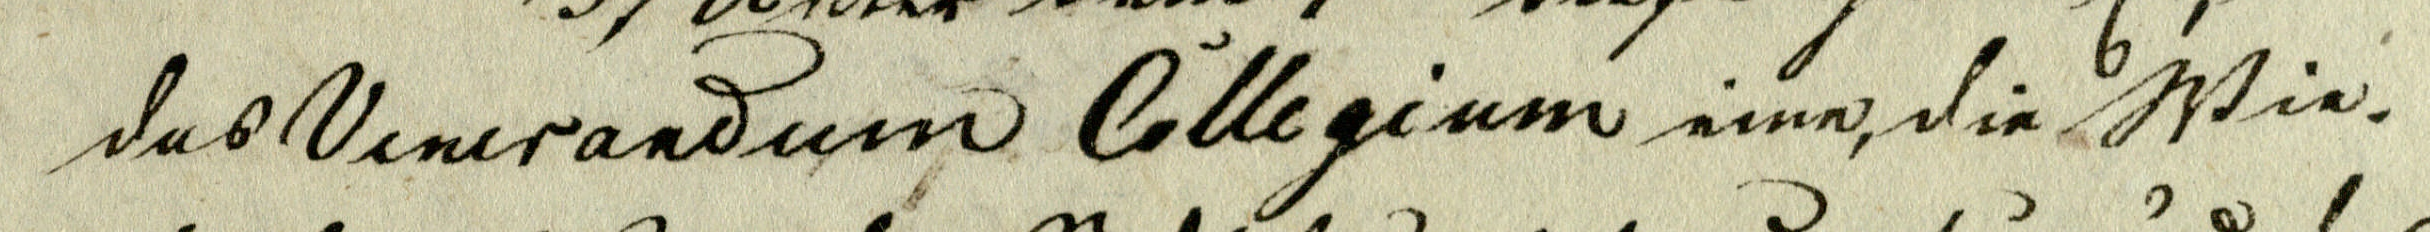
das Venerandum Collegium eine, die Wie¬
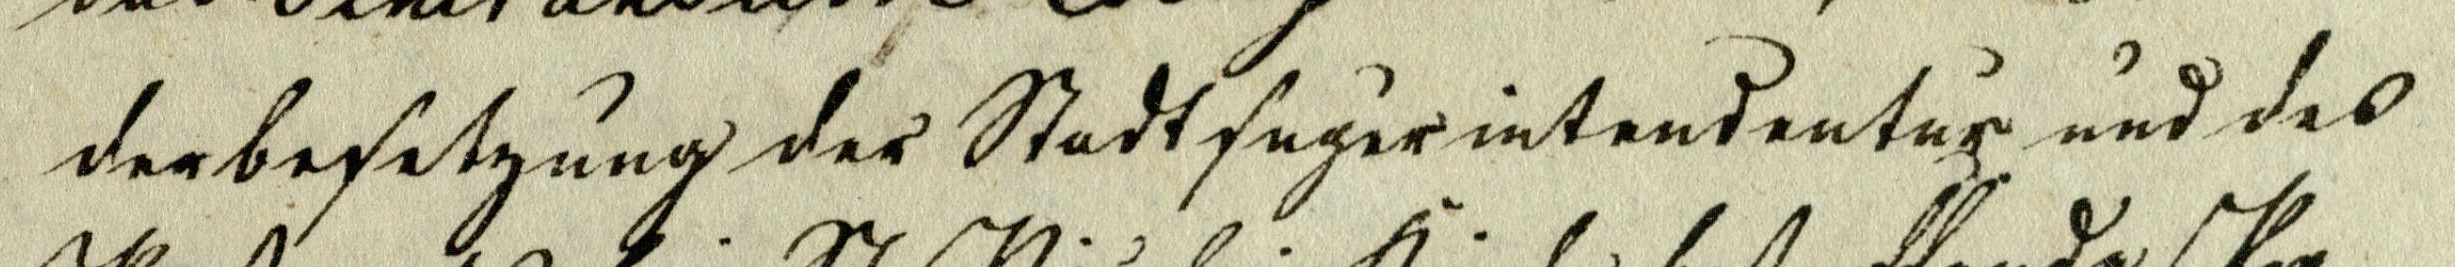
derbesetzung der Stadtsuperintendentur und des
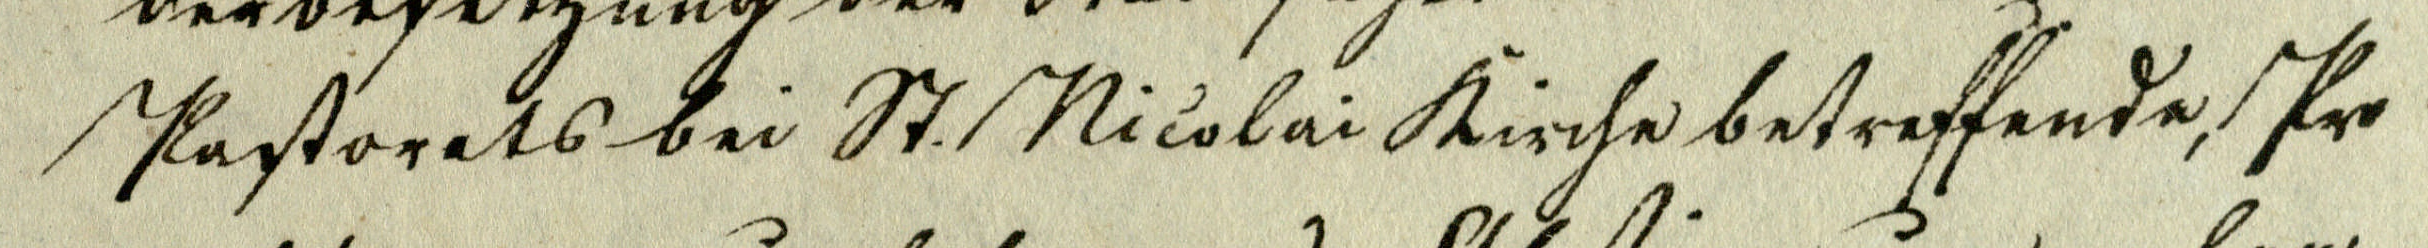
Pastorats bei St. Nicolai Kirche betreffende, Pro¬
